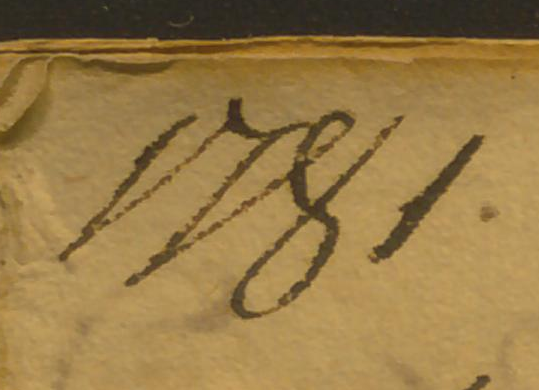1781
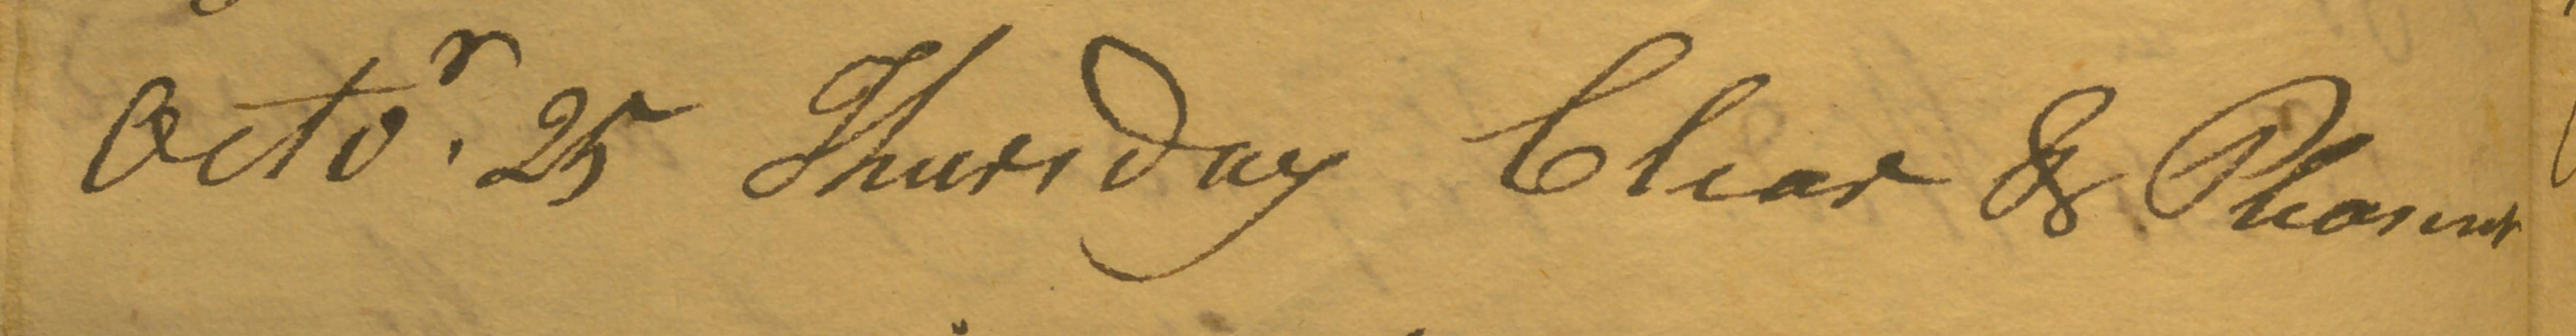Octo^r. 25 Thursday Clear & Pleasent
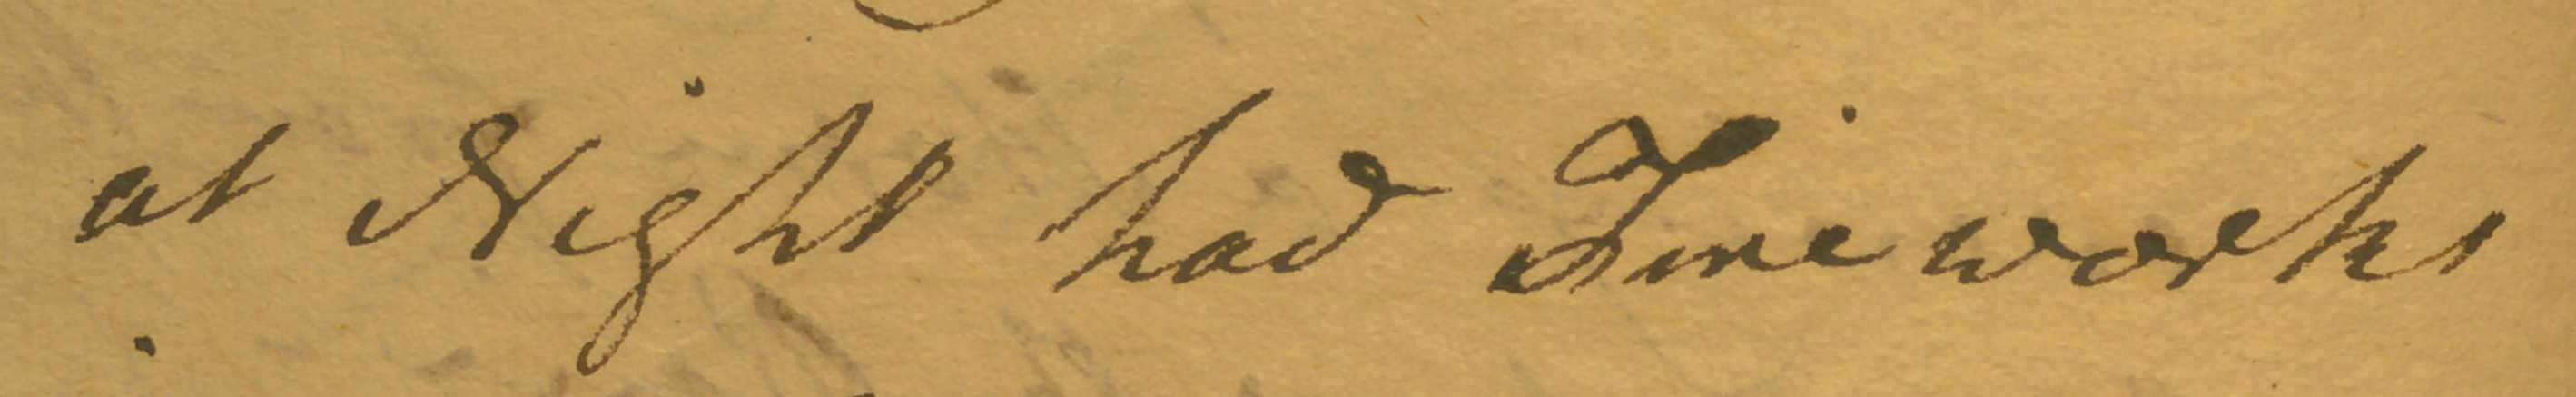at Night had Fireworks
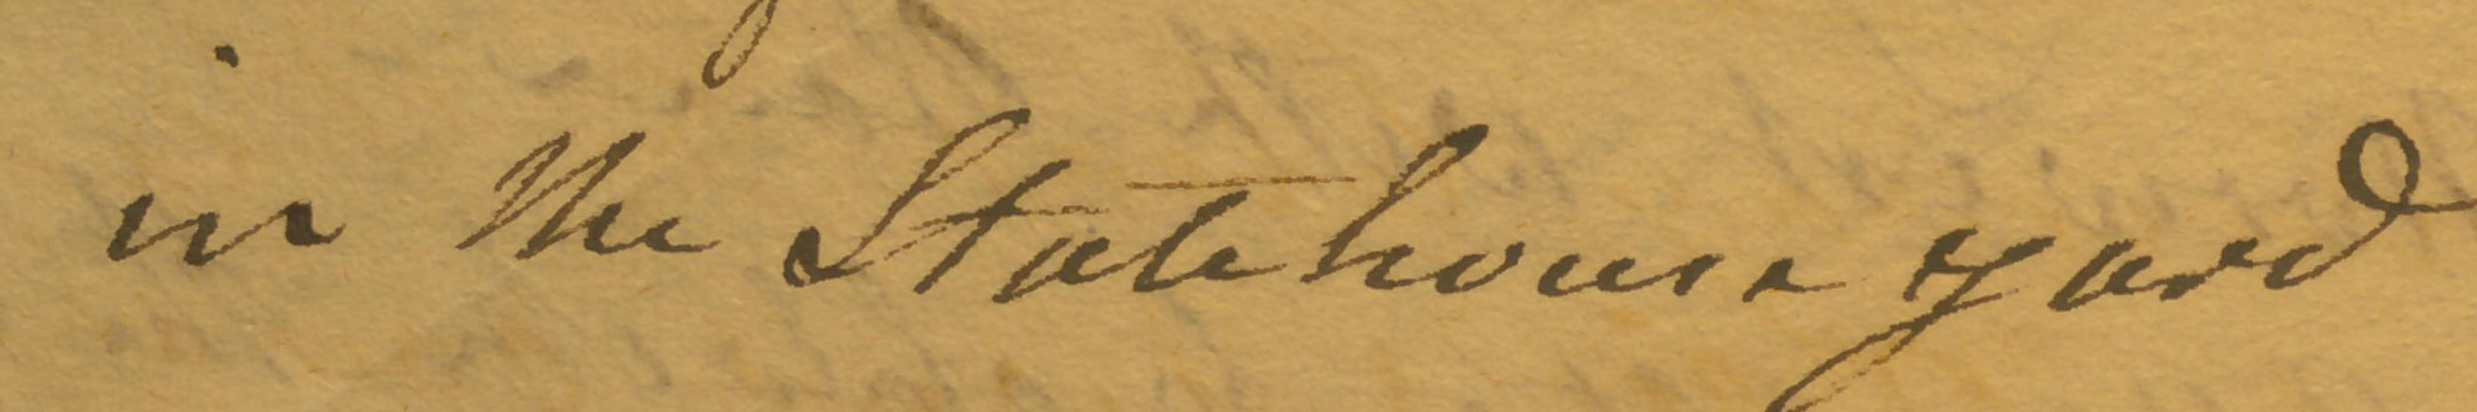in the Statehouse yard
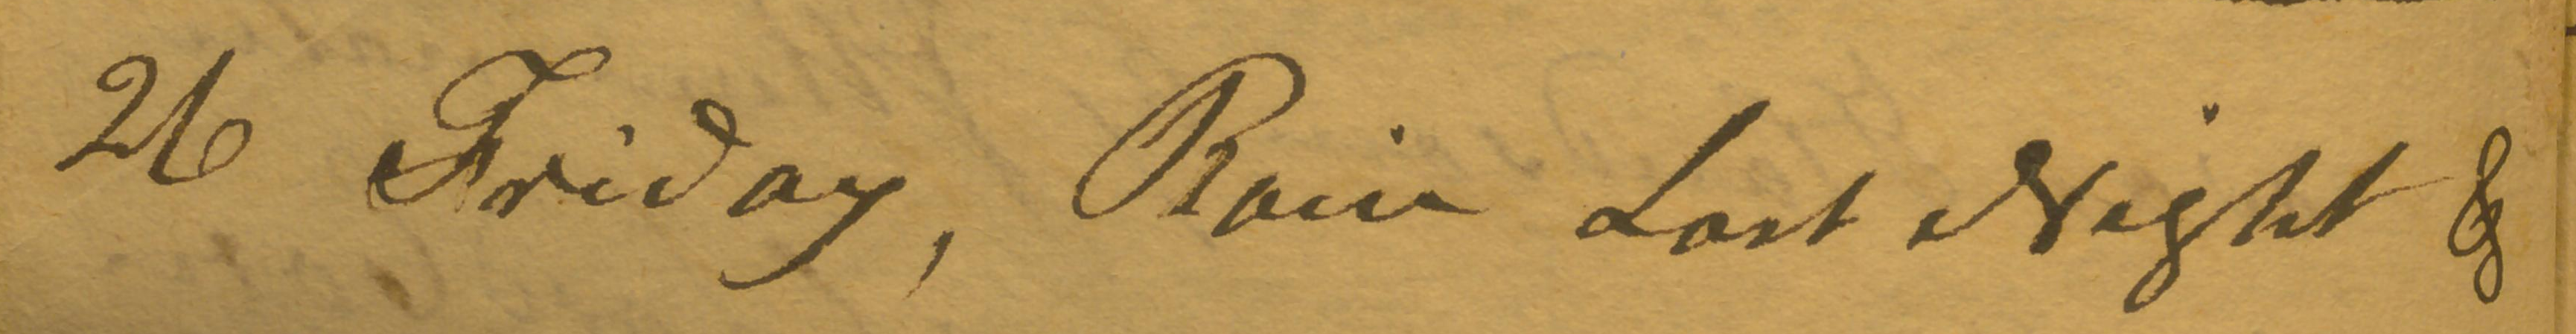26 Friday Rain Last Night &
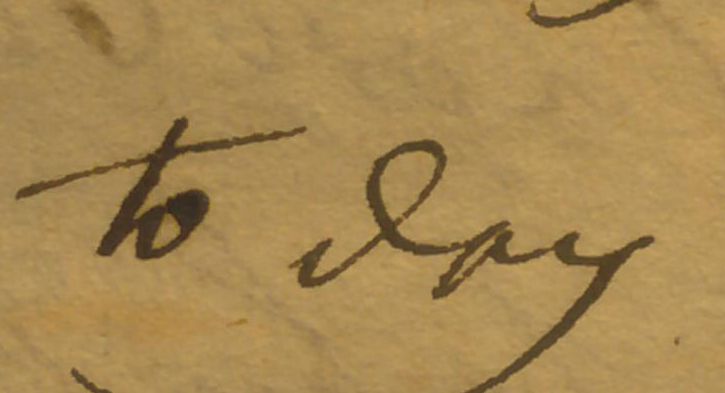to Day
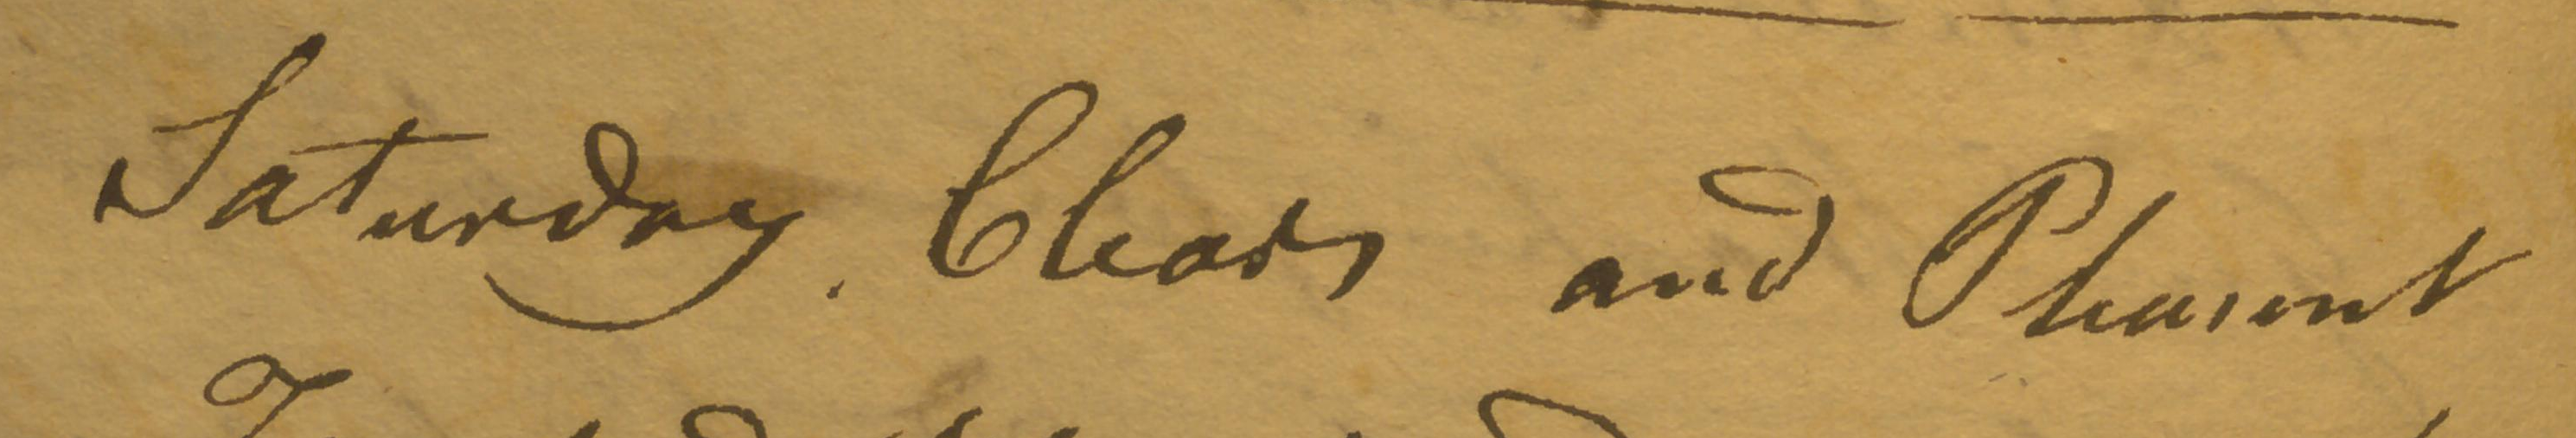Saturday Clear and Pleasent
